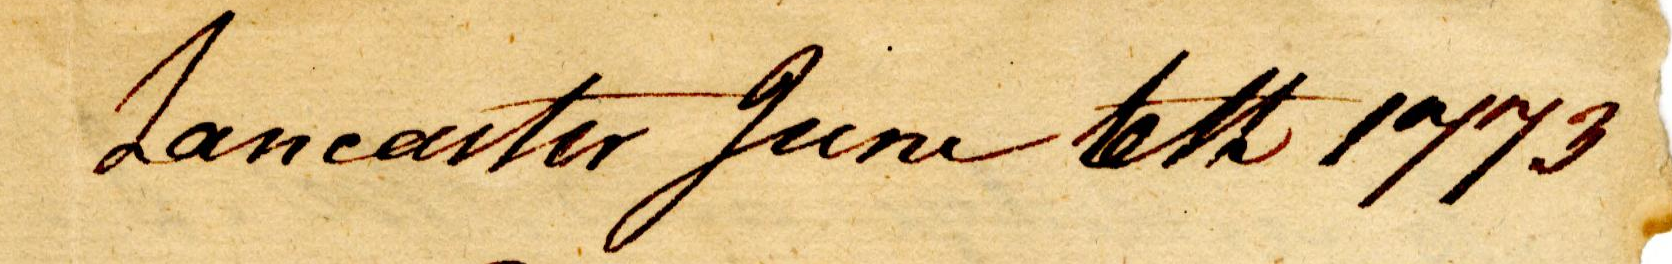Lancaster June 6th 1773
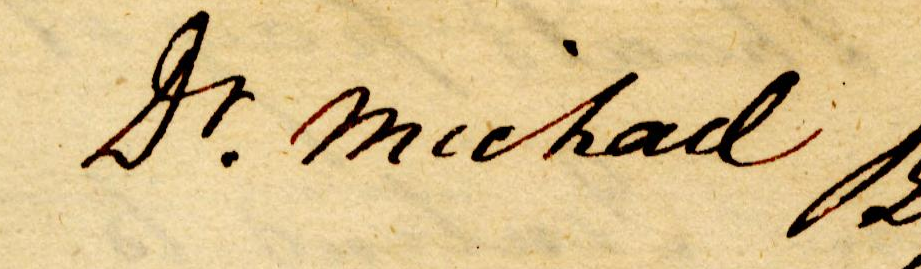D^r. Michael
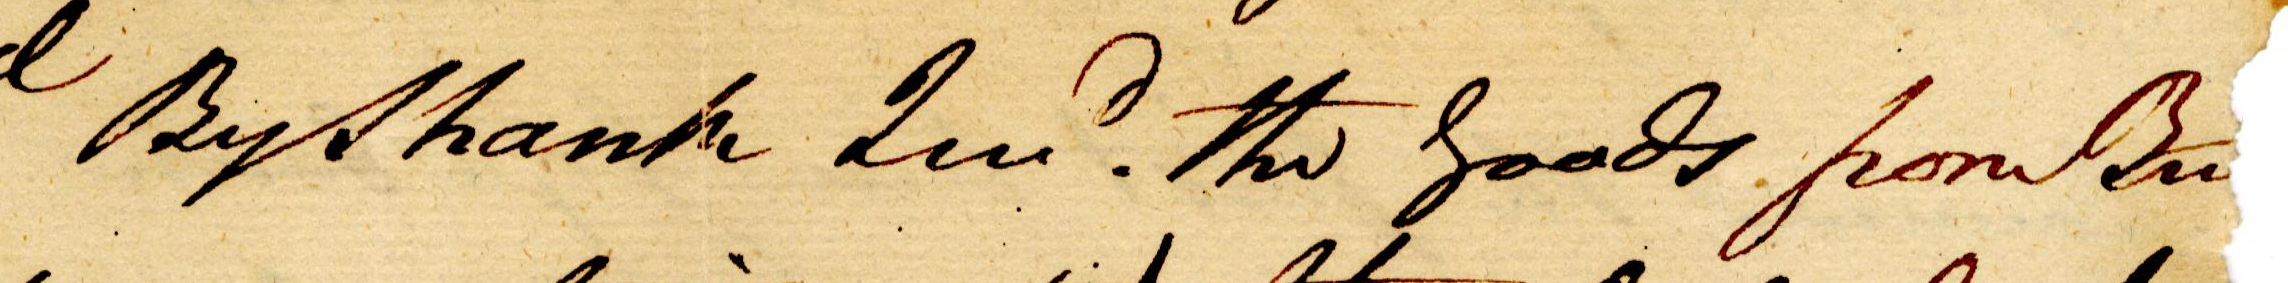By Shank rec^d. the Goods from Be
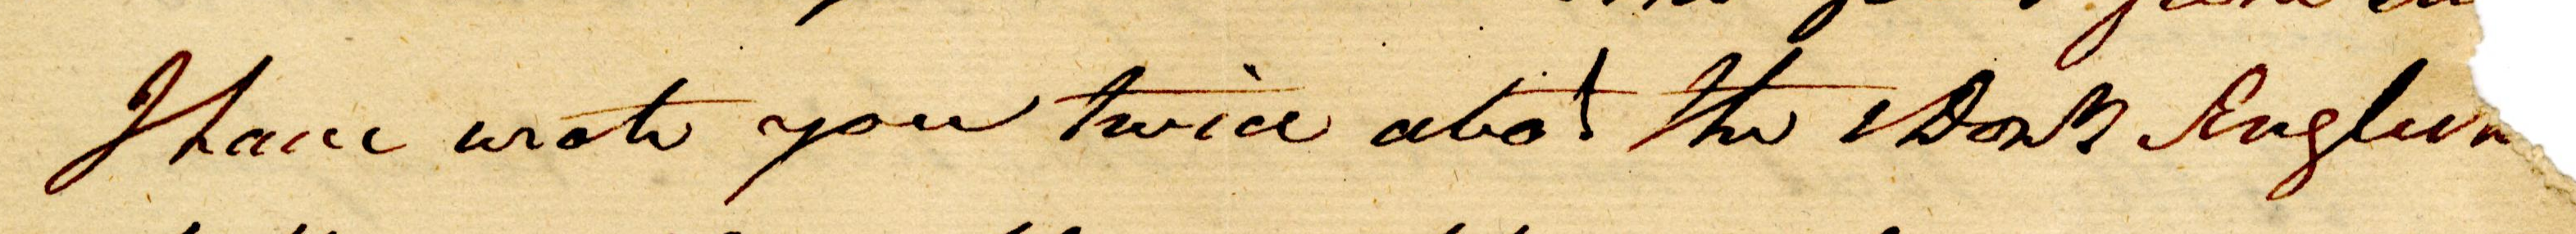I have wrote you twice abot the 1 Doz^n English
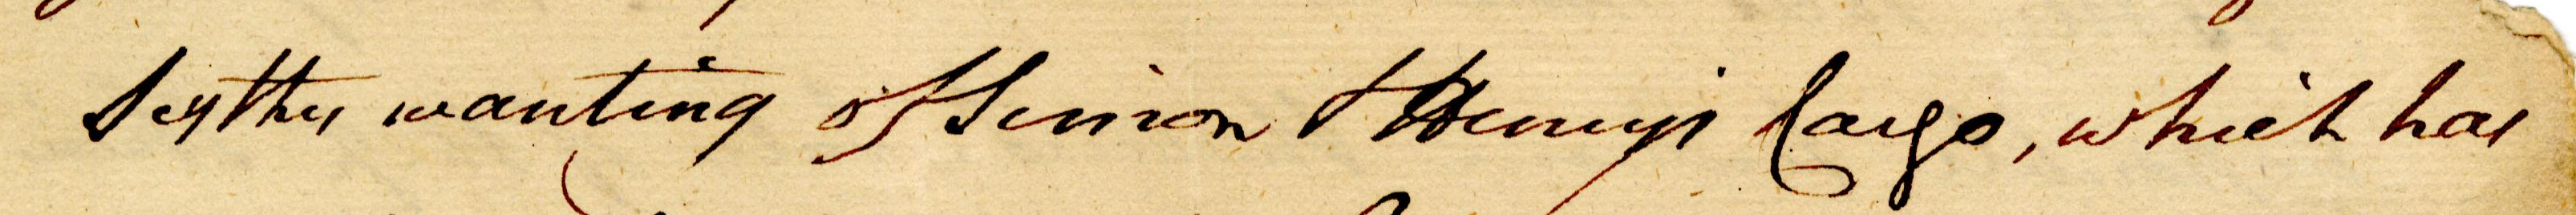Scythes wanting of Senion & Henrys Cays, which has
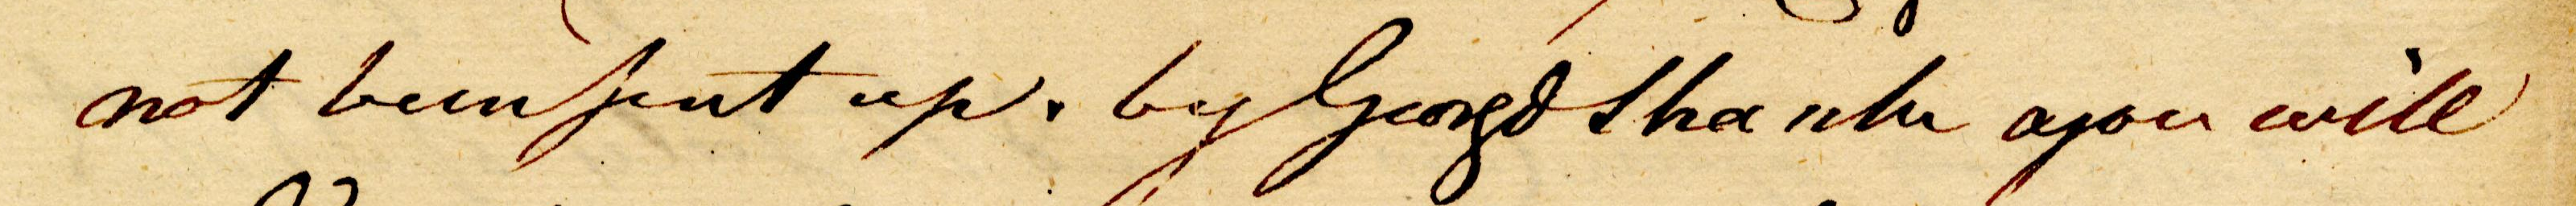not been sent up, by George Shank you will
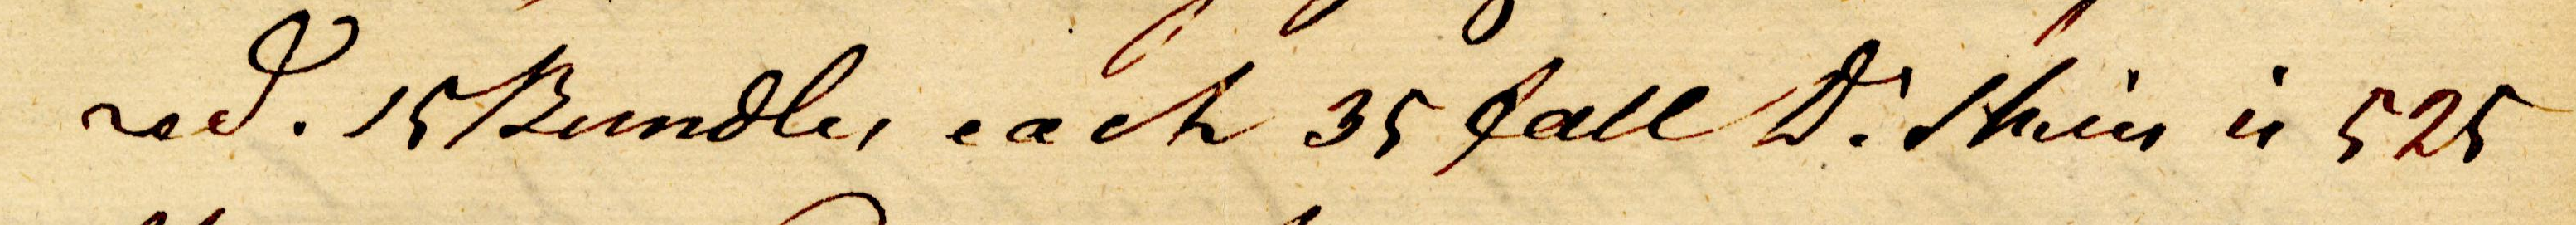rec^d. 15 Bundles each 35 & all D^r. skins is 525
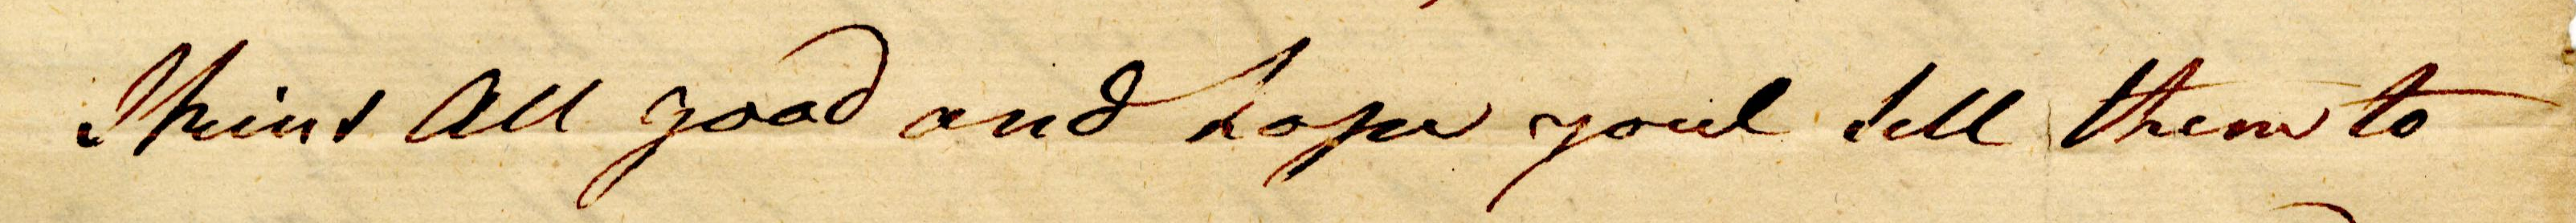Think All good and hope youl sell them to
